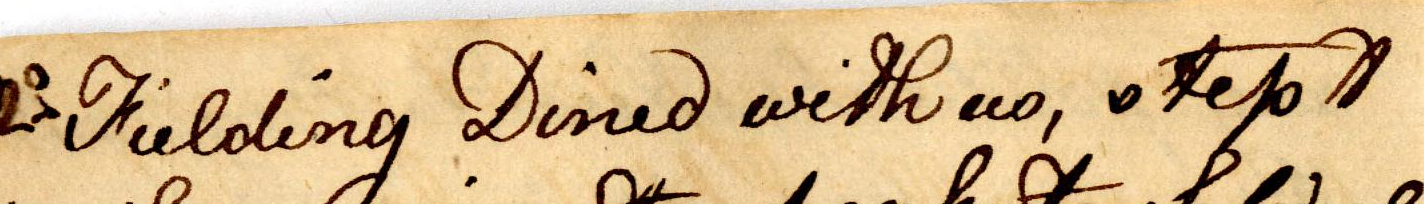Fielding Dined with us, stept
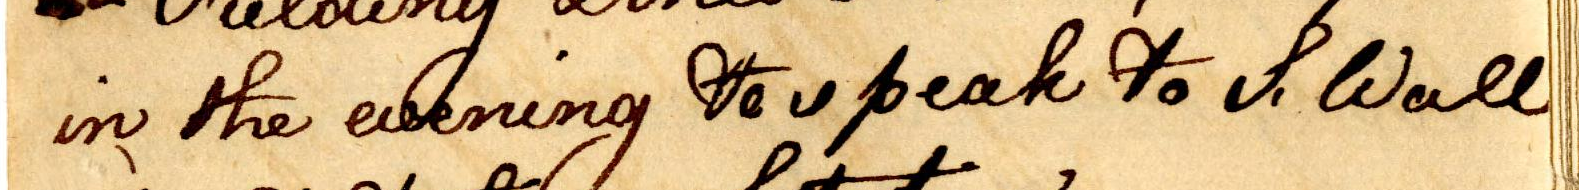in the evening to speak to S. Wall
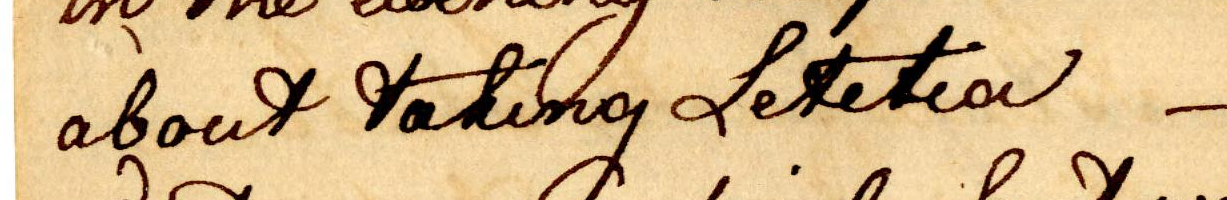about taking Letitia-
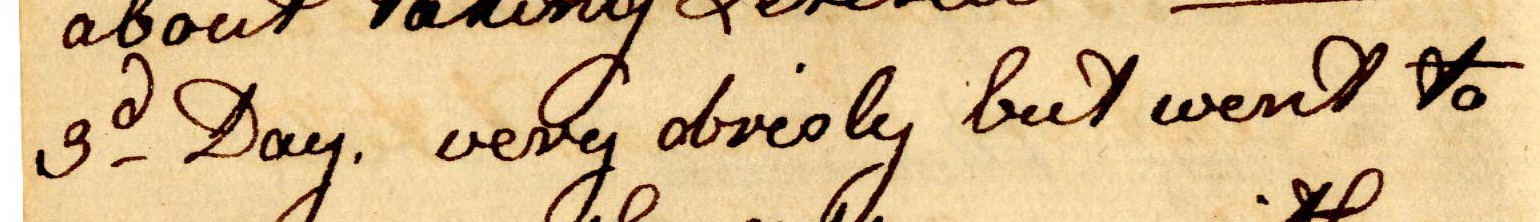3^d Day. very drisly but went to
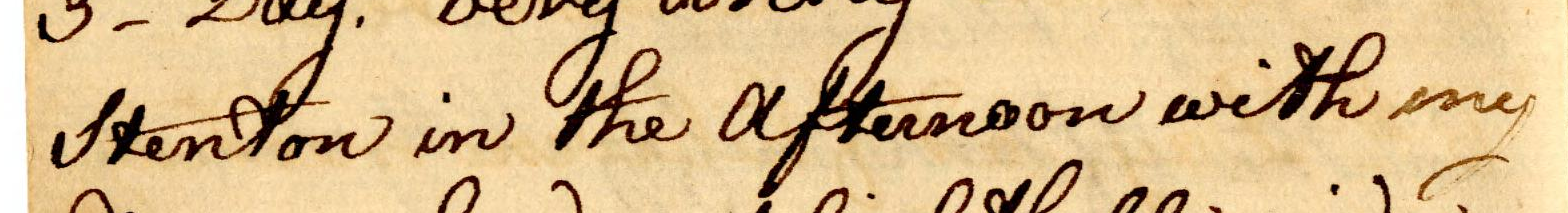Stenton in the Afternoon with my
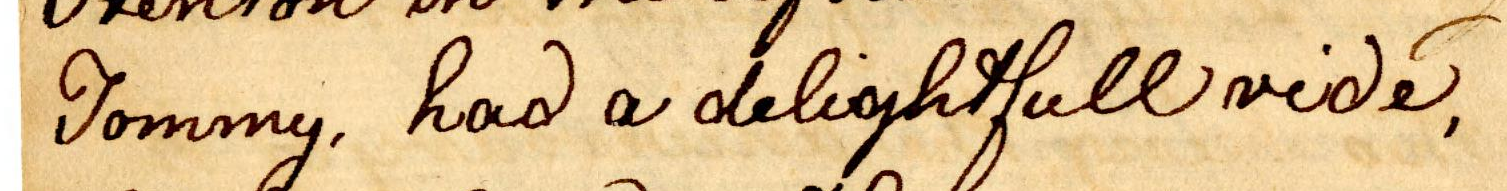Tommy, had a delightfull ride,
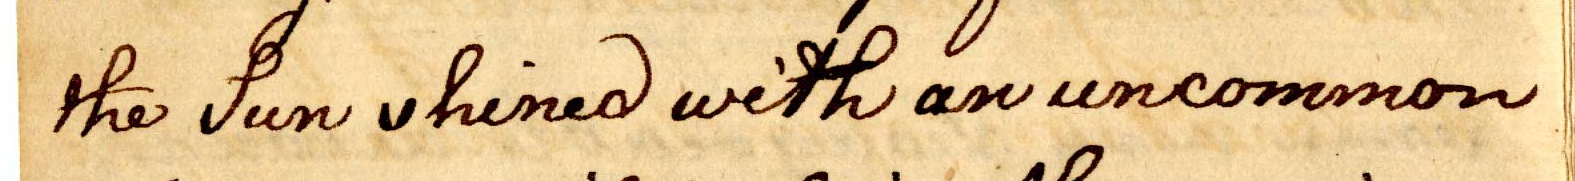the Sun shined with an uncommon
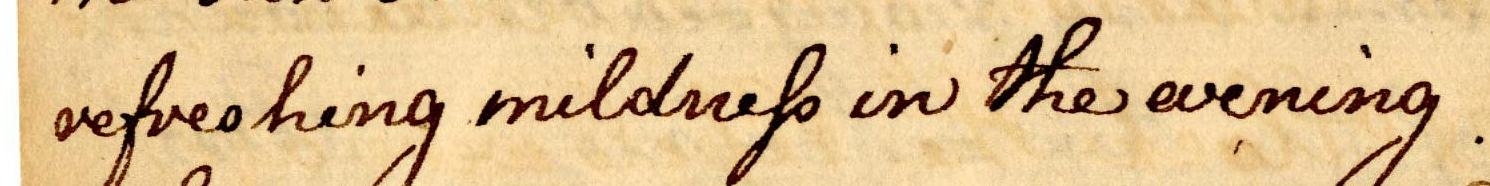refreshing mildness in the evening
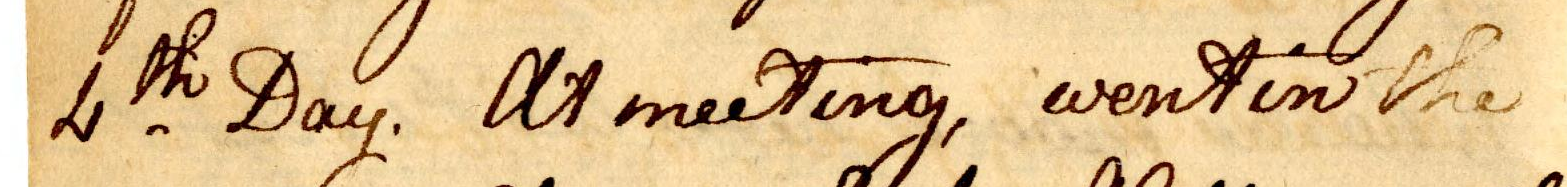4^th Day. At meeting, went in the
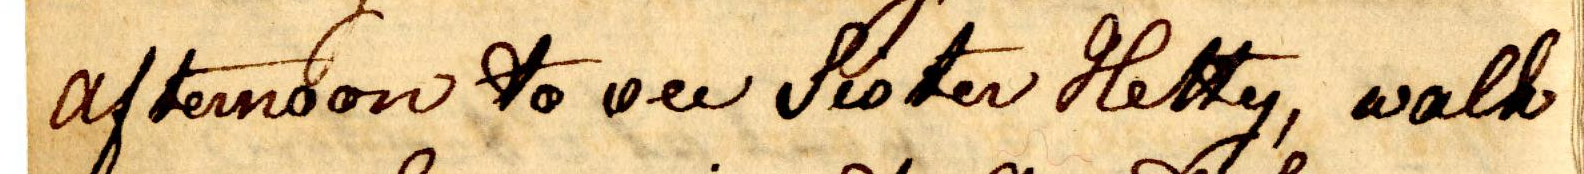Afternoon to see Sister Hetty, walk
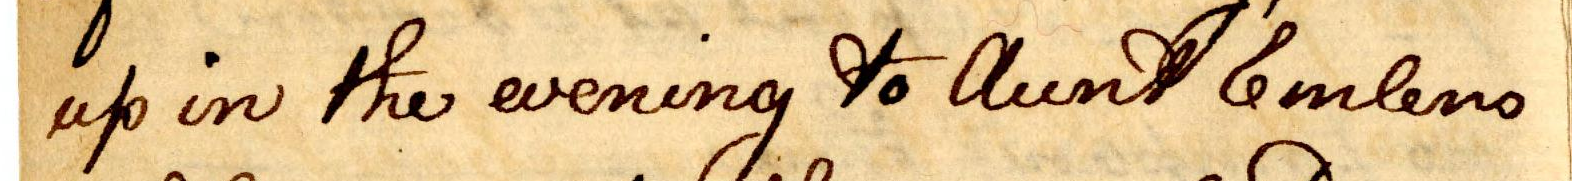up in the evening to Aunt Emlens
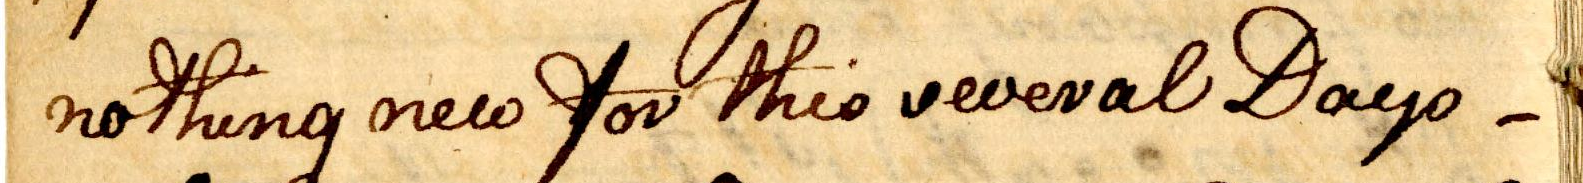nothing new for this several Days-
